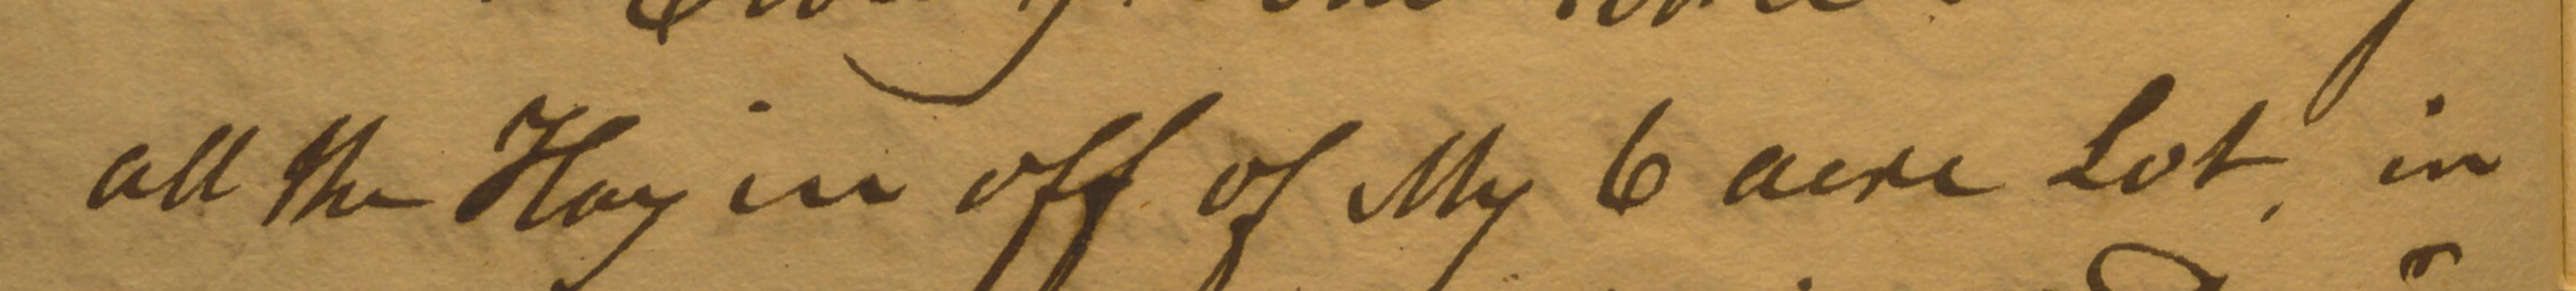all the Hay in off of My 6 acre Lot in
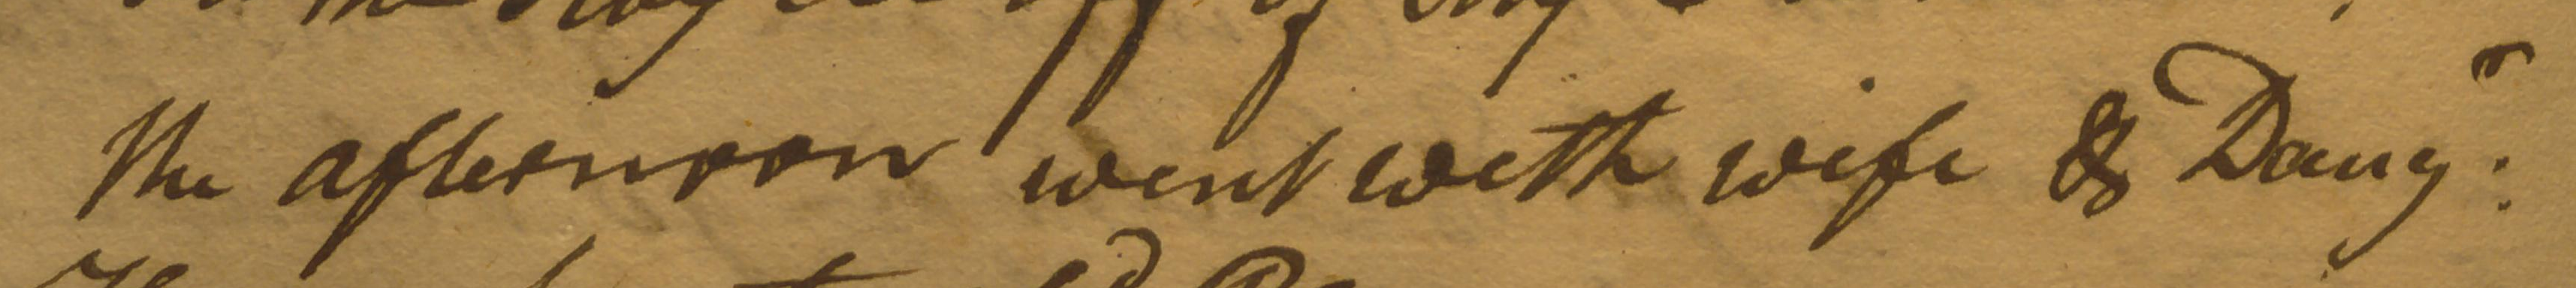the afternoon went with wife & Daug^r.
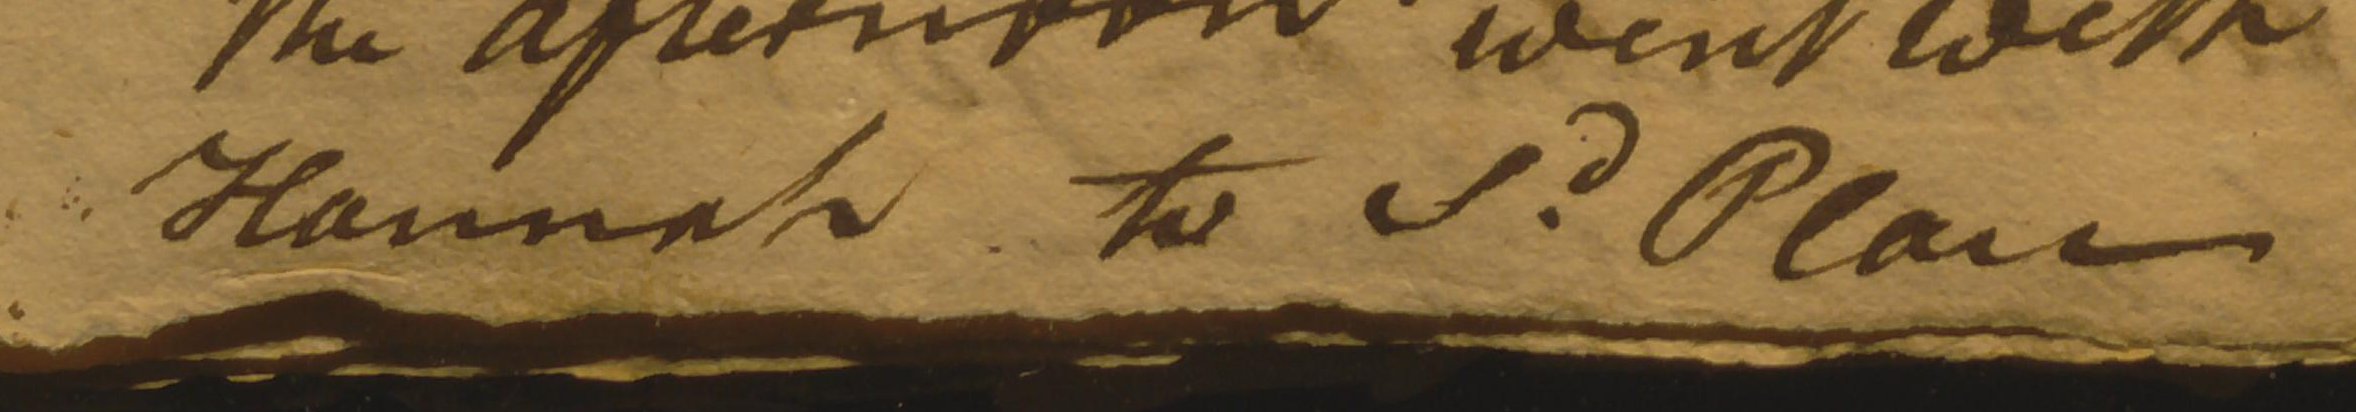Hannah to S^d. Place
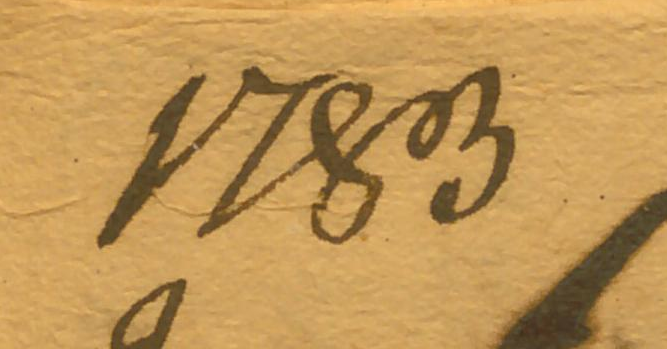1783
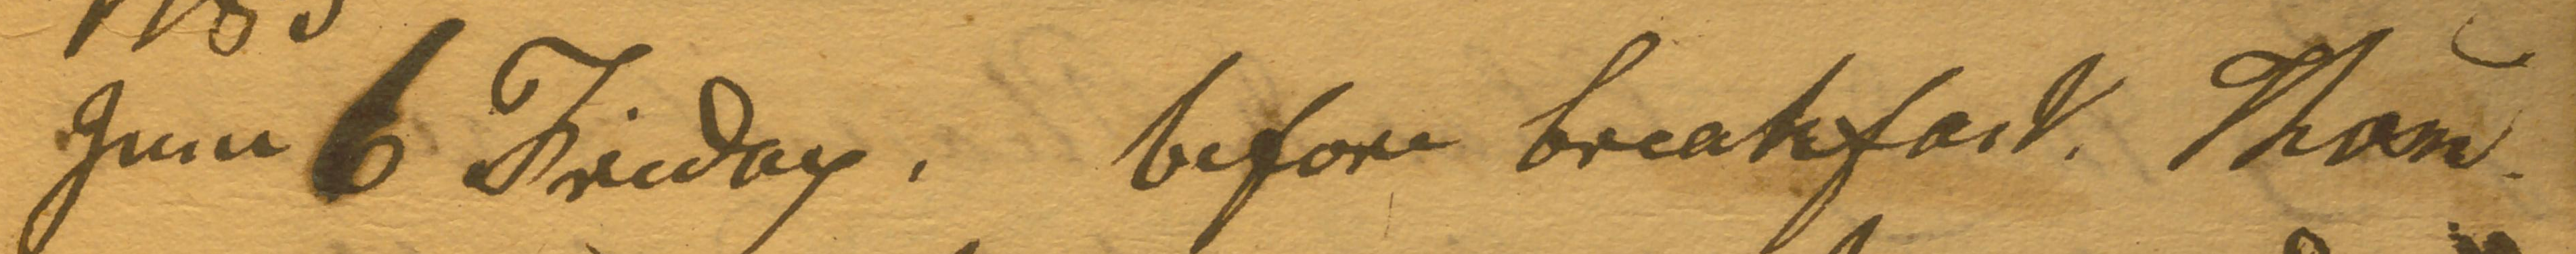June 6 Friday. before breakfast, Thom.
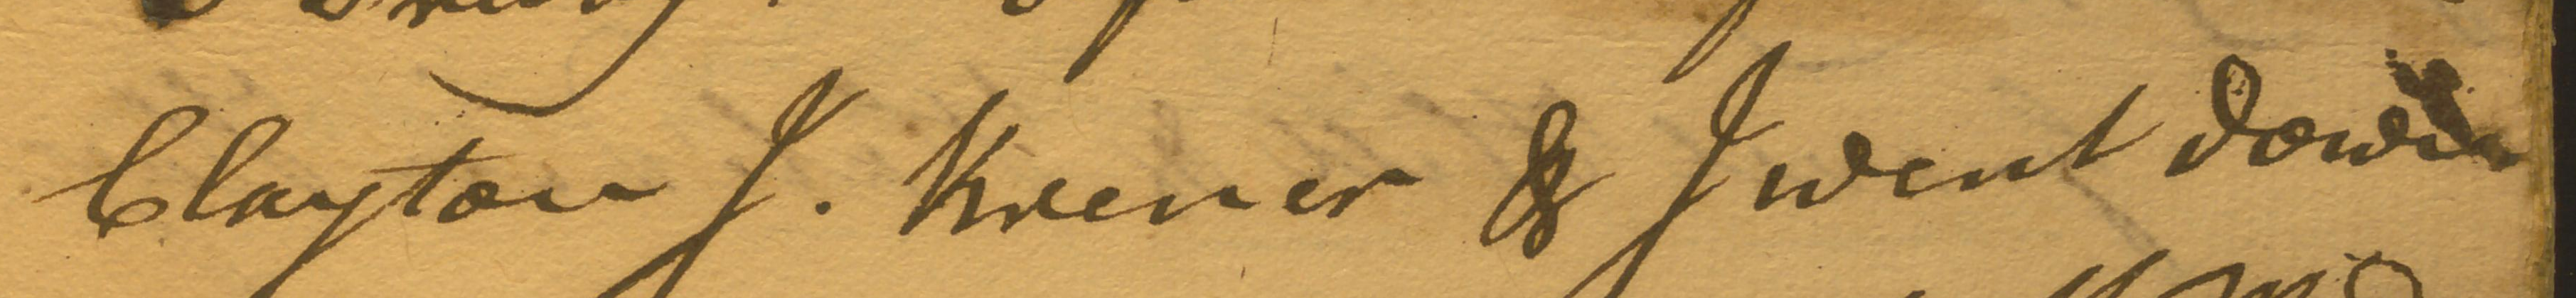Clayton J. Krener & I went down
